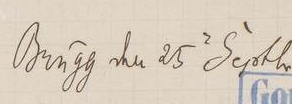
Brugg den 25t Septbr
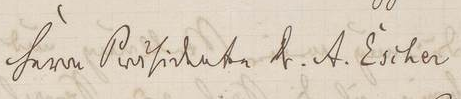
Herrn Präsidenten Dr. A. Escher
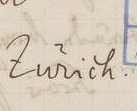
Zürich.
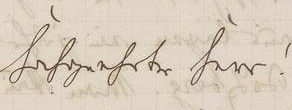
Hochgeehrter Herr!
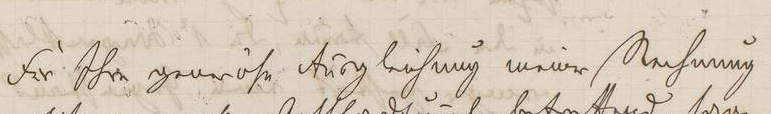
Für Ihre generöse Ausgleichung meiner Rechnung
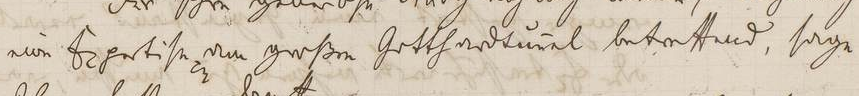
eine Expertise pp am großen Gotthardtunnel betreffend, sage
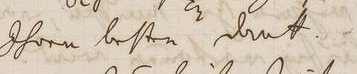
Ihnen besten Dank.
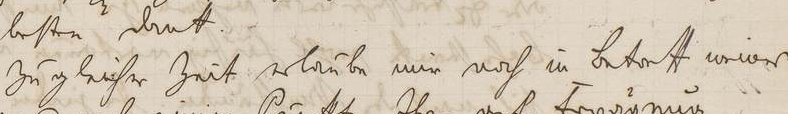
Zu gleicher Zeit erlaube mir noch in Betreff meines
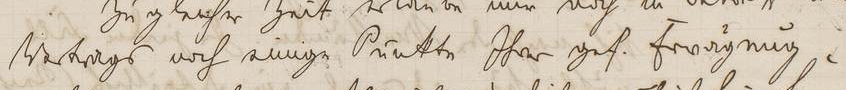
Vertrags noch einige Punkte Ihrer gef. Erwägung
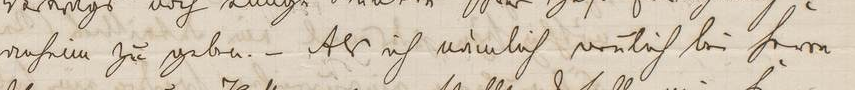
anheim zu geben. – Als ich nämlich neulich bei Herrn
